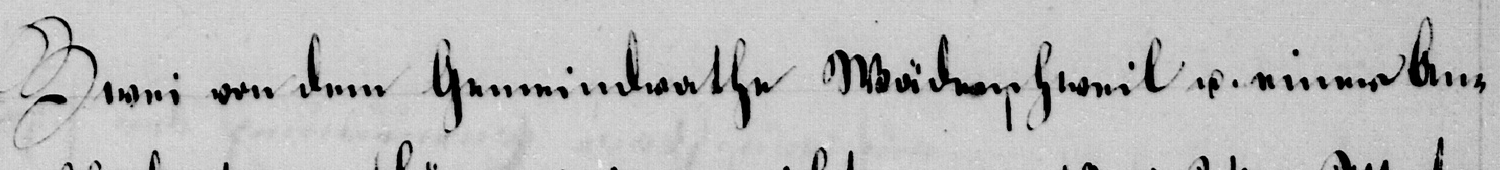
Zwei von der Gemeinde Wädenschweil u. einer Anz¬
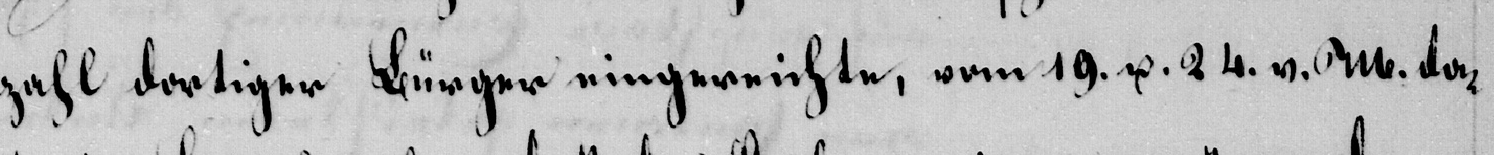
ahl dortiger Bürger eingereichte, vom 19. u. 24. v. M. da¬
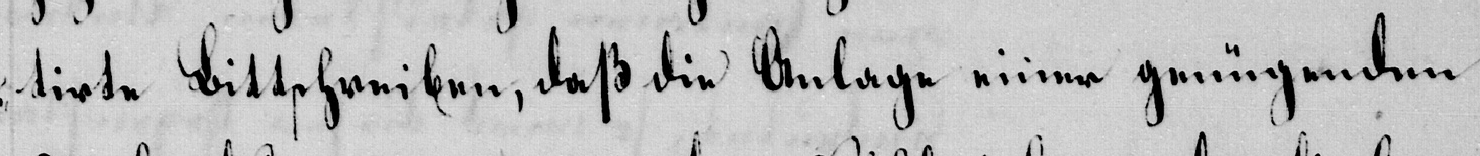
tirte Bittschreiben, daß die Anlage einer genügenden
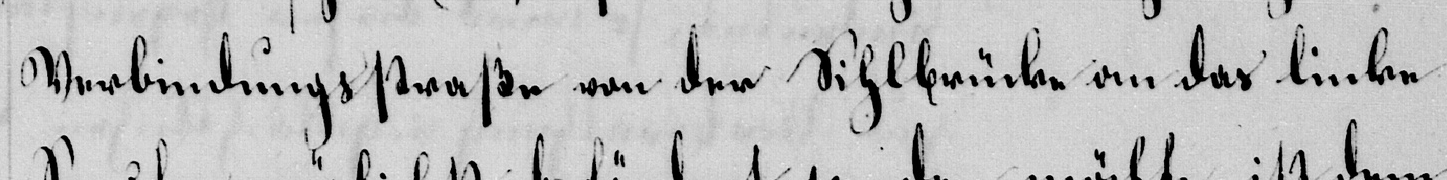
Verbindungsstraße von der Sihlbrücke an das linke
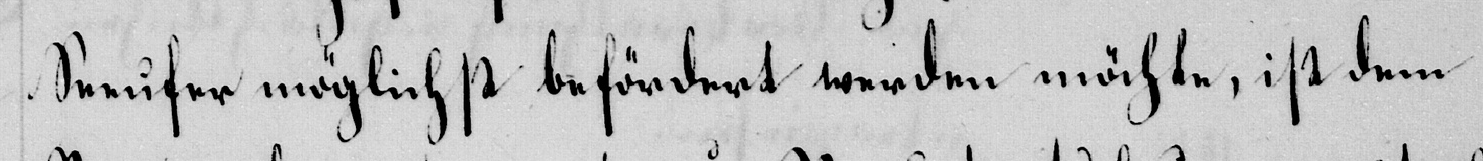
Seeufer möglichst befördert werden möchte, ist dem
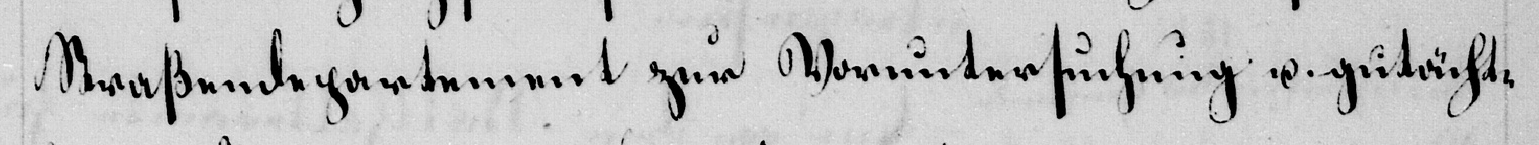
Straßendepartement zur Voruntersuchung u. gutächt¬
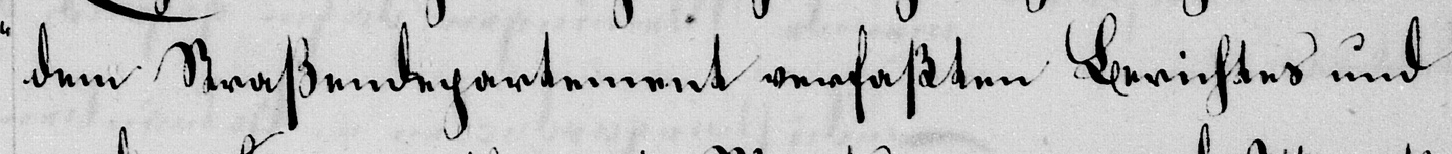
dem Straßendepartement verfaßten Berichtes und
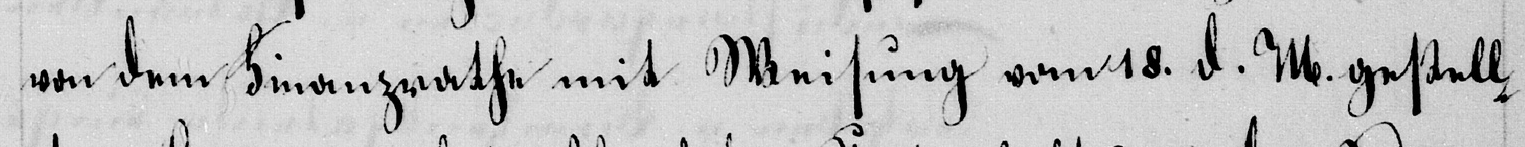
von dem Finanzrathe mit Weisung vom 18. d. M. gestell¬
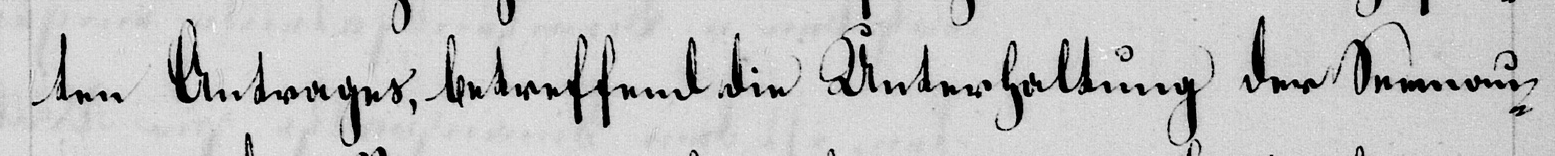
ten Antrages, betreffend die Unterhaltung der Seemau¬
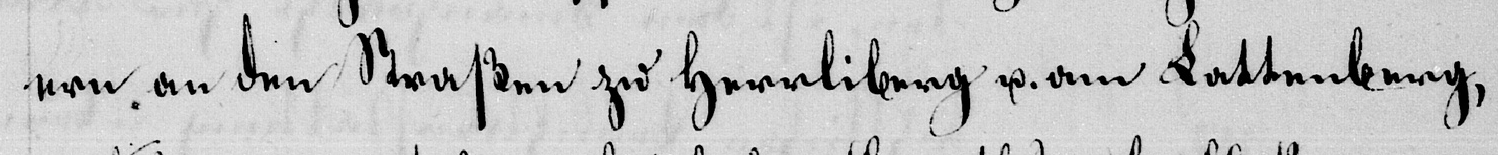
ern an den Straßen zu Herrliberg u. am Lattenberg,
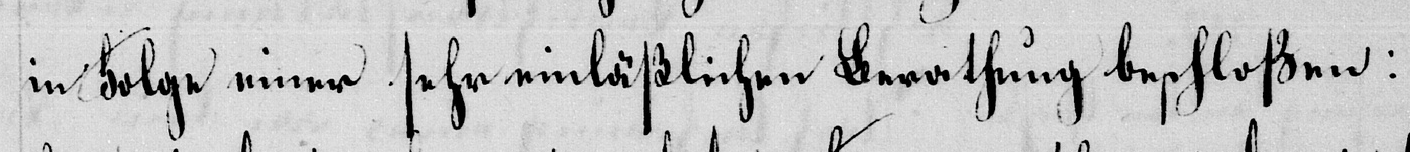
in Folge einer sehr einläßlichen Berathung beschloßen:
